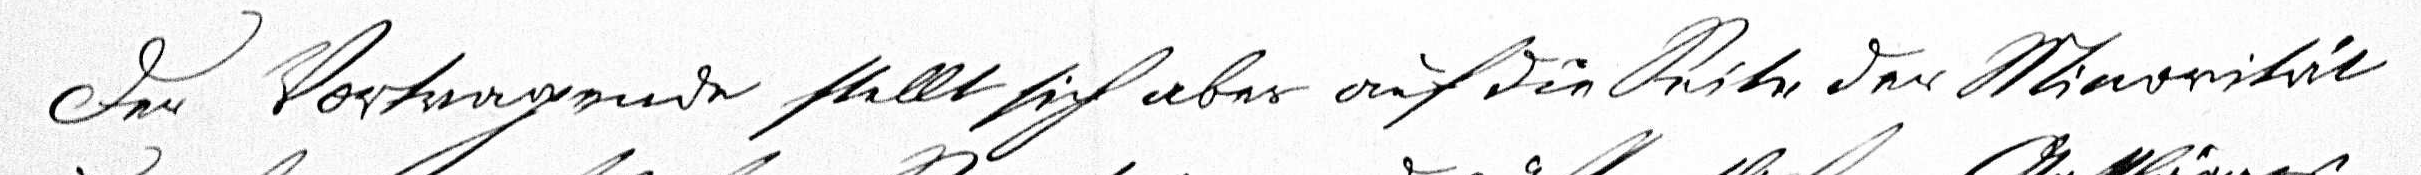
Der Votragende stellt sich aber auf die Seite der Minorität
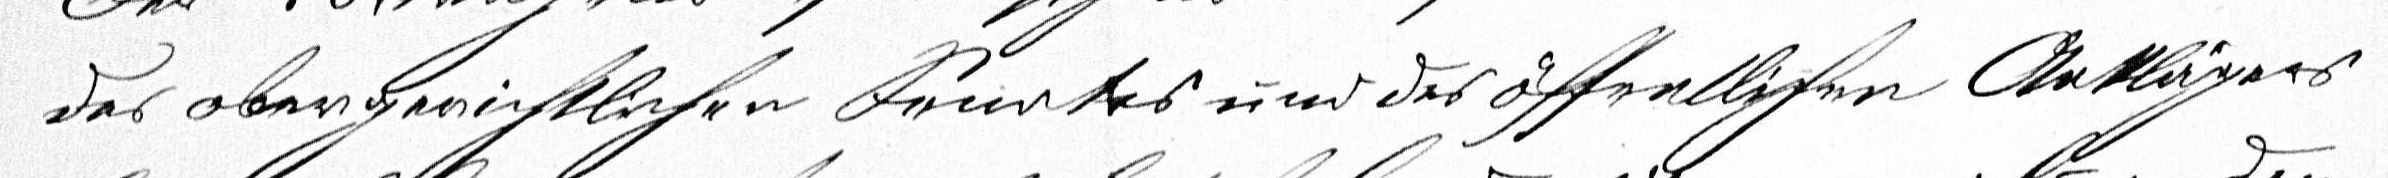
der obergerichtlichen Senates und des öffentliche Anklägers
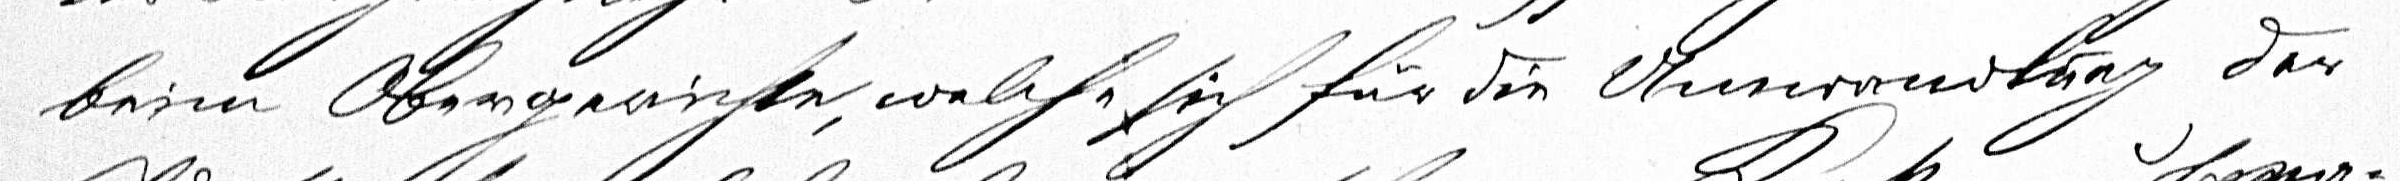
beim Obergerichte, welche sich für die Umwandlung der
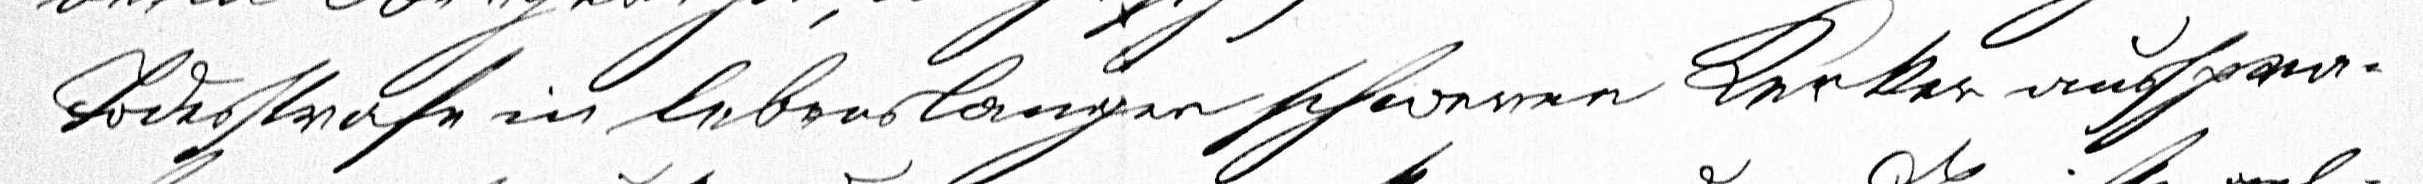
Todesstrafe in lebenslangen schweren Kerker ausspra¬
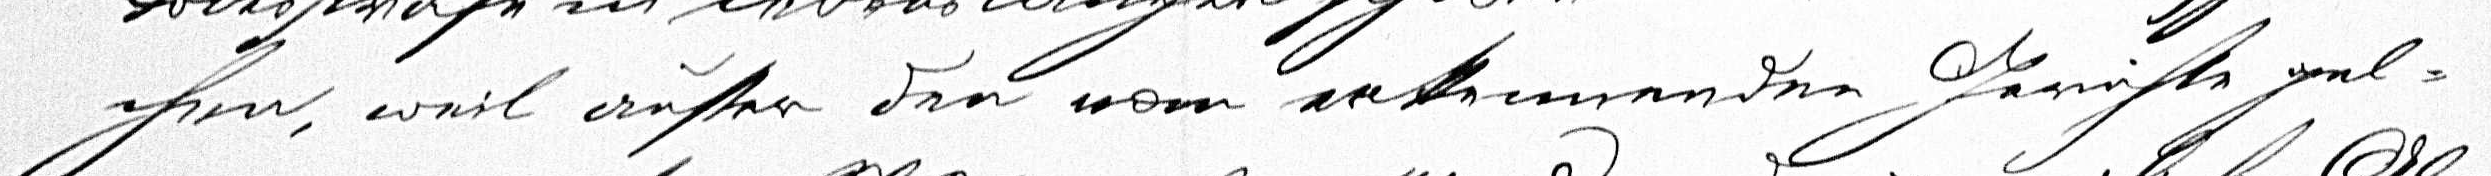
chen, weil außer den vom erkennenden Gerichte gel¬
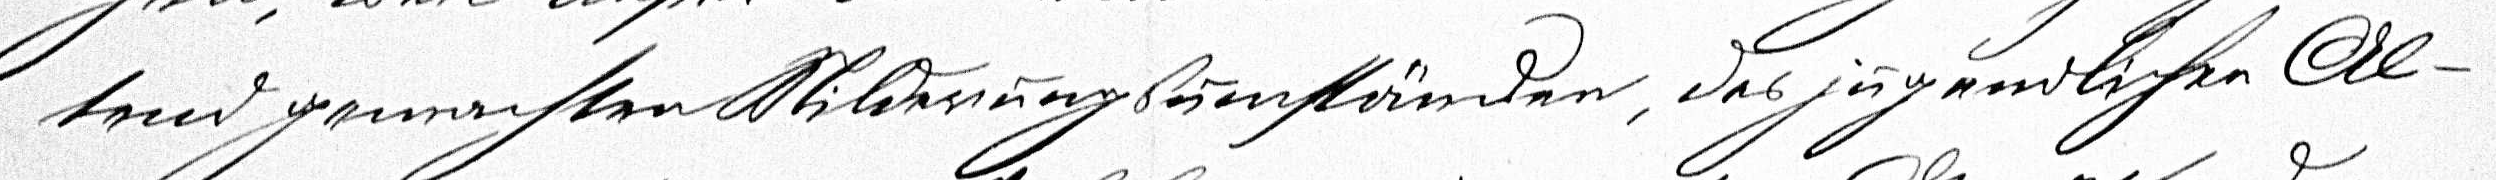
tend gemachten Milderungsumständen, des jugendlichen Al¬
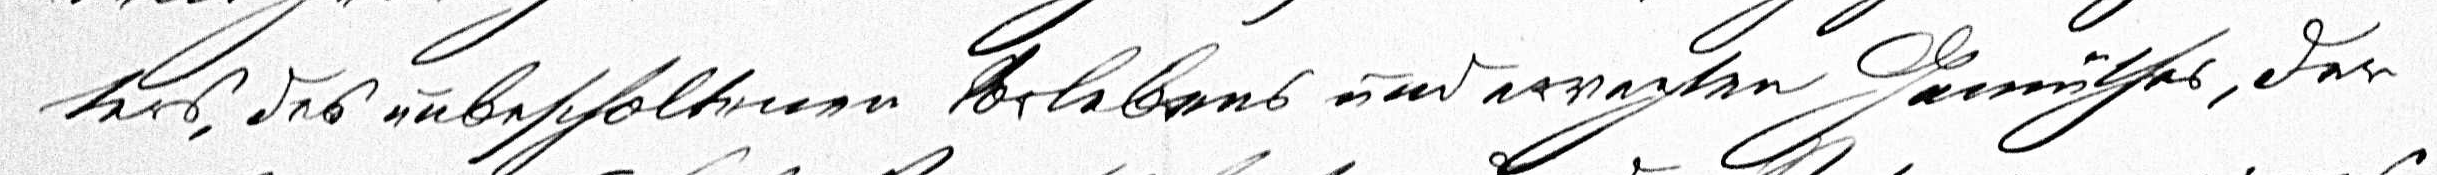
ters, des unbescholtenen Vorlebens und erregten Gemüthes, der
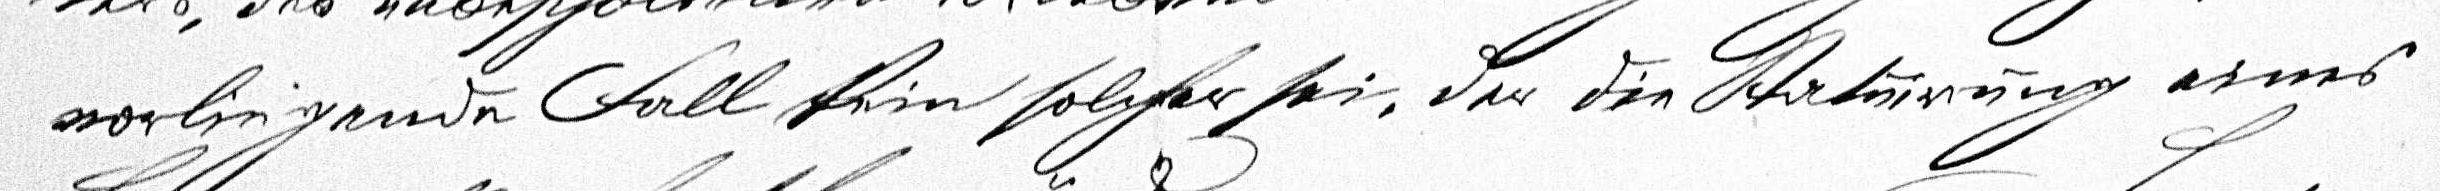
vorliegende Fall kein solcher sei, der die Statuirung eines
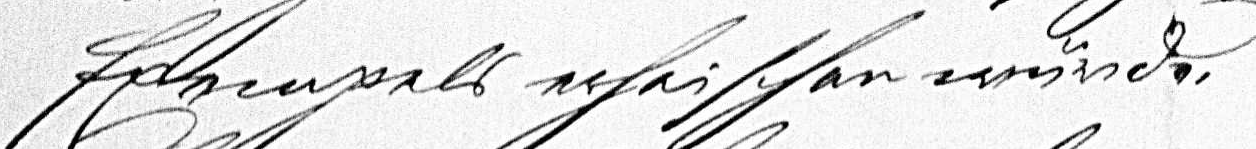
Exempels erheischen würde.
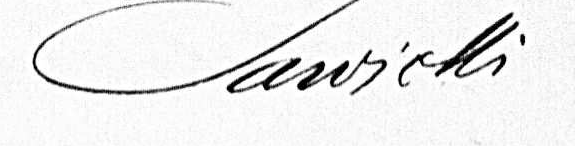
Sawicki
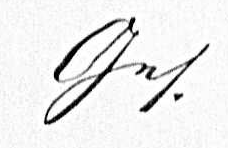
Ges.
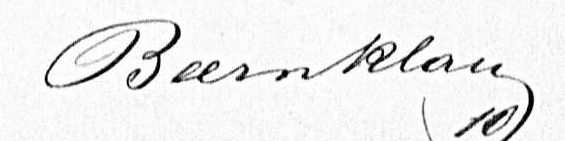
Baernklau
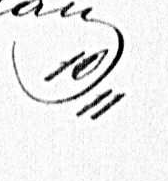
10/11
